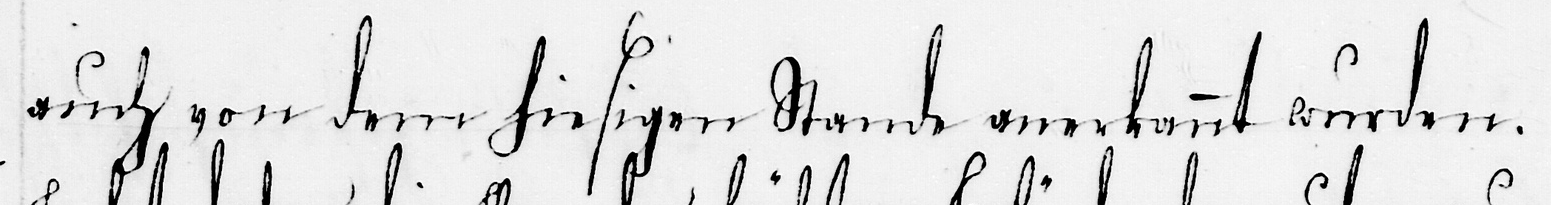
auch von dem hiesigen Stande anerkannt wurden.
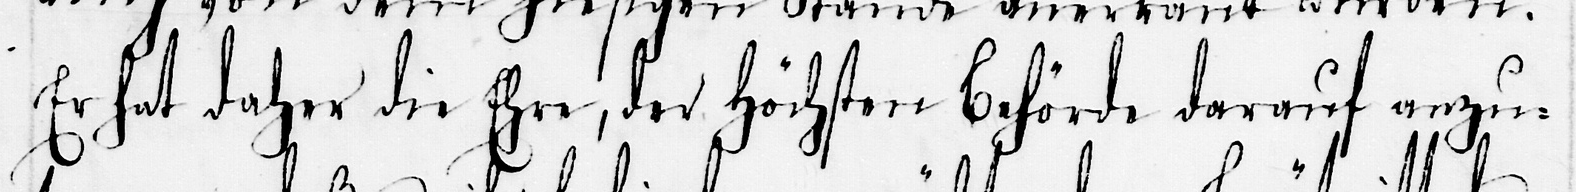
Er hat daher die Ehre, der Höchsten Behörde darauf anzu¬
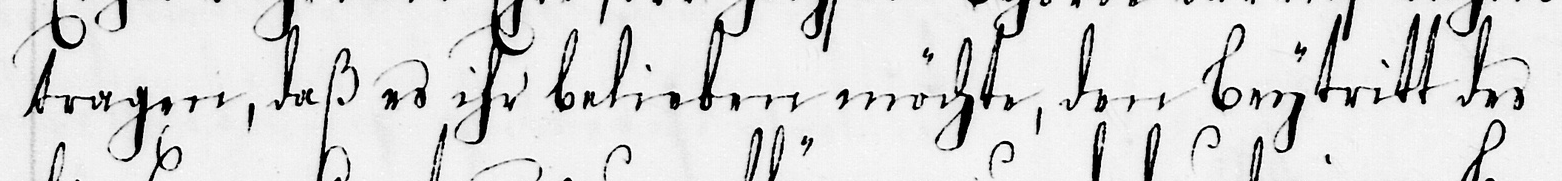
tragen, daß es ihr belieben möchte, den Beytritt des
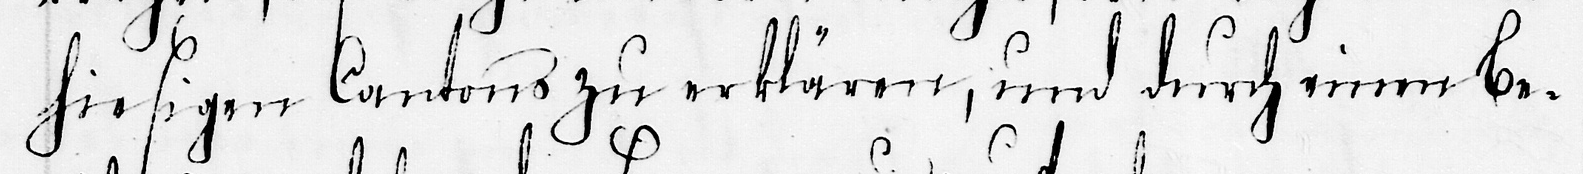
hiesigen Cantons zu erklären, und durch einen Be¬
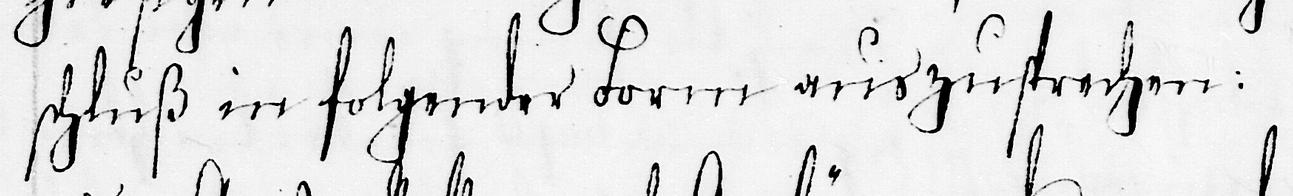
schluß in folgender Form auszusprechen:
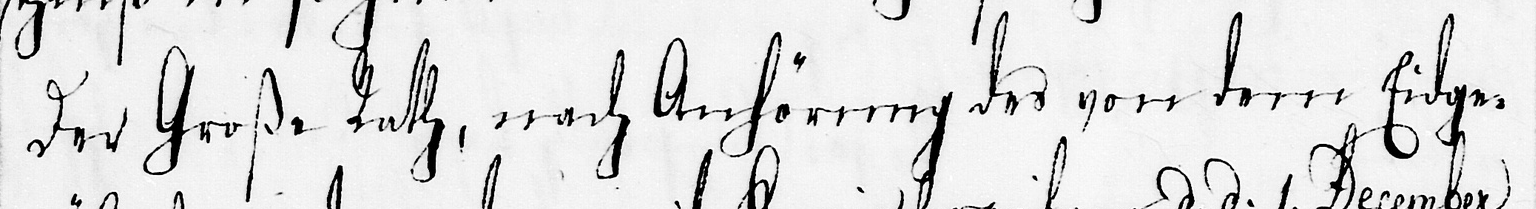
Der Große Rath, nach Anhörung des von dem Eidge¬
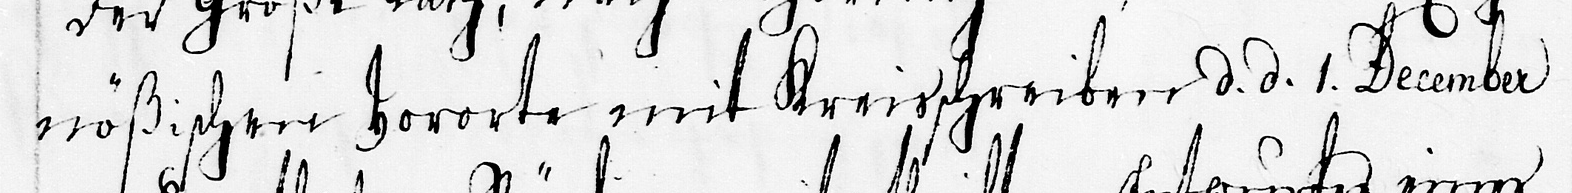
nößischen Vororte mit Kreisschreiben d. d. 1. December
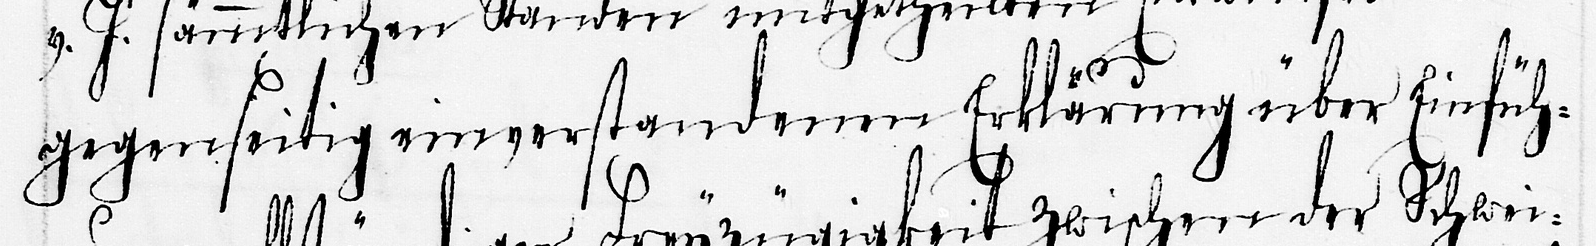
gegenseitig einverstandenen Erklärung über Einfüh¬
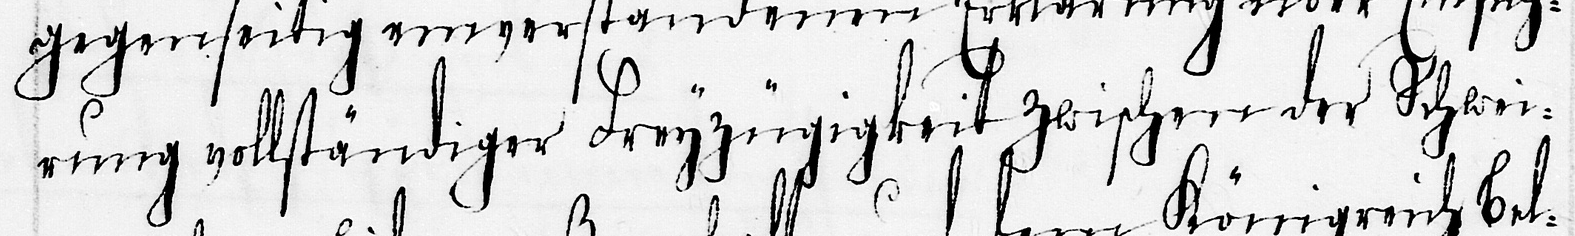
rung vollständiger Freyzügigkeit zwischen der Schwei¬
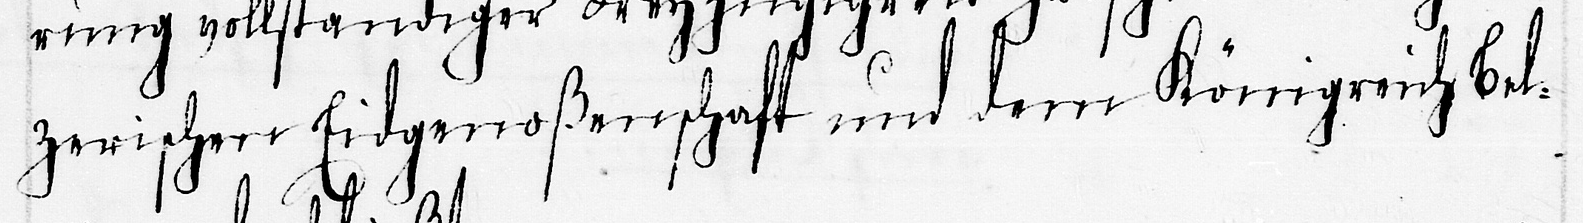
zerischen Eidgenoßenschaft und dem Königreich Bel¬
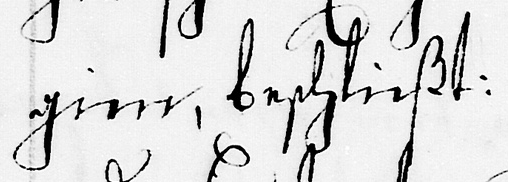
gien, beschließt:
